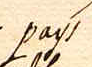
paȳs
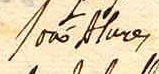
Joaõ Alures
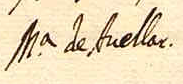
M.a de Auellar.
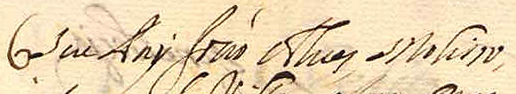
seu Pay Joaõ Alues Moleiro,
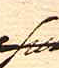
e sua
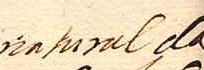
natural da
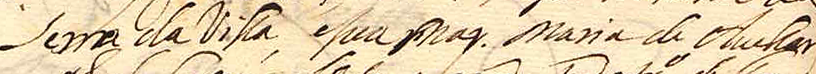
Serra da Villa, e sua may. Maria de Auellar
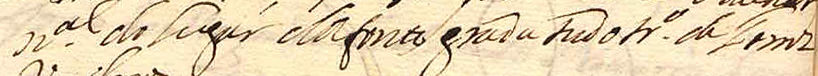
n.al do lugar da fonte grada tudo tr.o de Torres
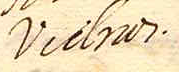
Vedras.
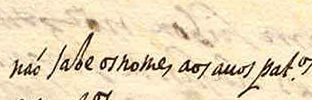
naõ sabe os nomes aos auos pat.os
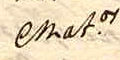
e mat.os
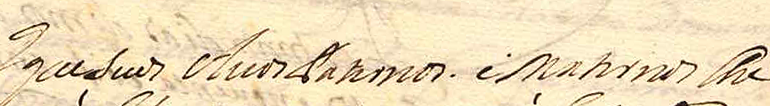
E que seus Auos Paternos. e Maternos lhe
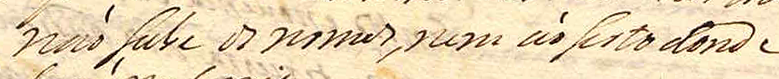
naõ sabe os nomes, nem ao serto donde
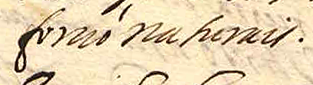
forão naturais.
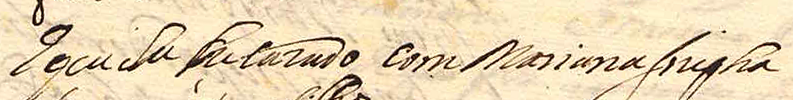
E que elle he cazado com Mariana Josepha
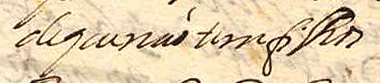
de que naõ tem filhos
